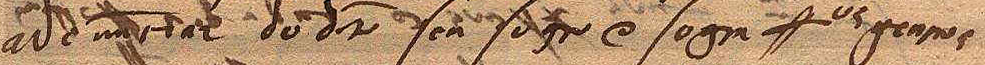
a den̄uciar do dito seu sogro e sogra ffos genrros
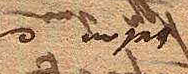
e noras
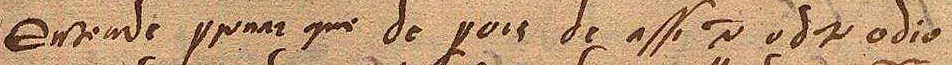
Entende prouar que de pois de assi c̄o o dito odio
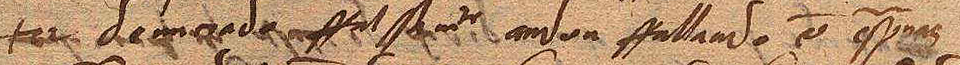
ter denuciado ffalssamte andou ffallando c̄o ēspuos
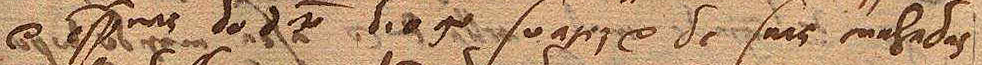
e ēspuas do dito diogo soarez e de suas cunhadas
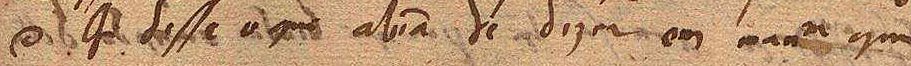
e lhe disse o que avīa de dizer em manra que
